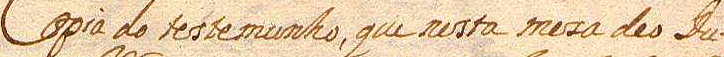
Copia do testemunho, que nesta meza deo Du
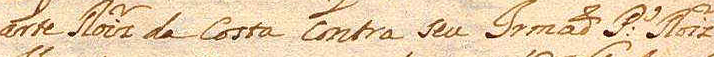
arte Roīz da Costa contra seu Irmaõ P:o Roīz
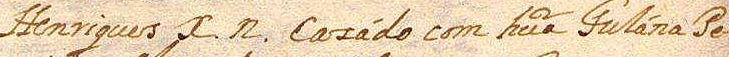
Henriques x. n. cazádo com hūa Fulána Pe
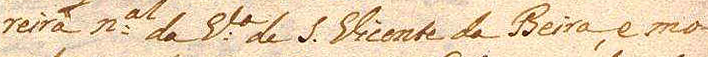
reira n:al da V:a de S. Vicente da Beira, e mo
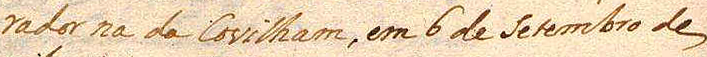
rador na da Covilham, em 6 de setembro de
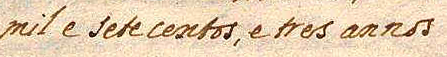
mil e setecentos, e tres annos
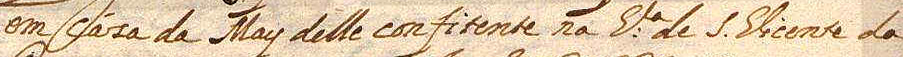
em cáza da May delle confitente na V.a de S. Vicente da
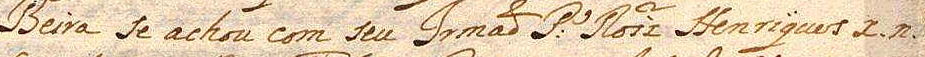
Beira se achou com seu Irmaõ P:o Roīz Henriques x. n.
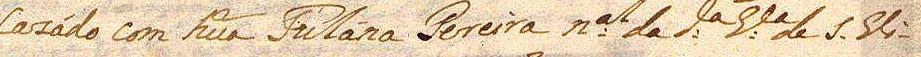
Cazádo com hūa Fulána Pereira n:al da d.a V:a de S. Vi
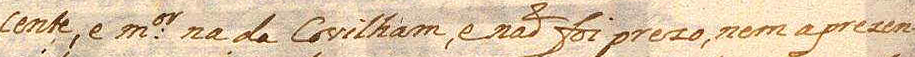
cente, e m:or na da Covilham, e naõ foi prezo, nem aprezen
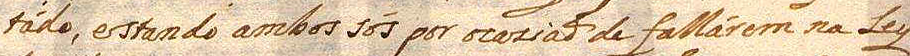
tádo, estando ambos sós por ocaziaõ de fallárem na Ley
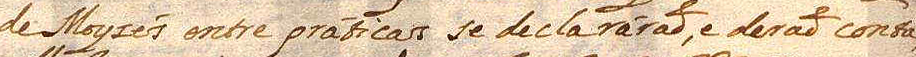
de Moyzés entre práticas se declaráraõ, e deraõ conta,
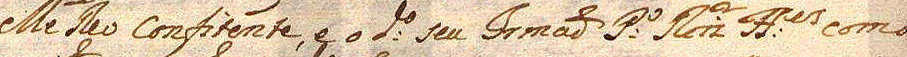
elle Reo Confitente, e o d:o seu Irmaõ P:o Roīz H:es como
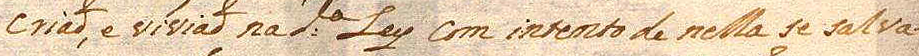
criaõ, e viviaõ na d:a Ley com intento de nella se salva
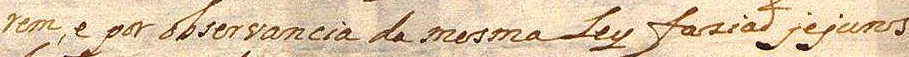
rem, e por observancia da mesma Ley faziaõ jejuns
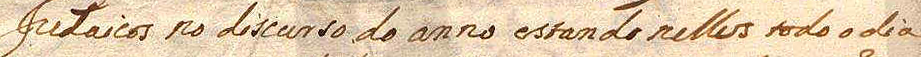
Judaicos no discurso do anno estando nelles todo o dia
